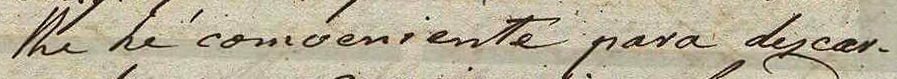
lhe he comveniente para descar
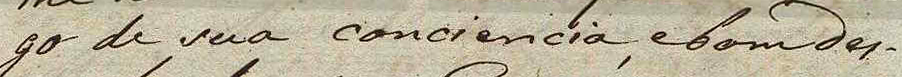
go de sua conciencia, e bom des
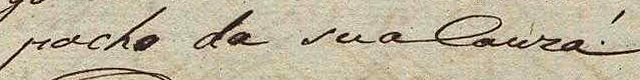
pacho da sua Cauza.
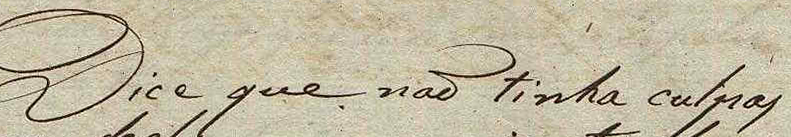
Dice que naõ tinha culpas
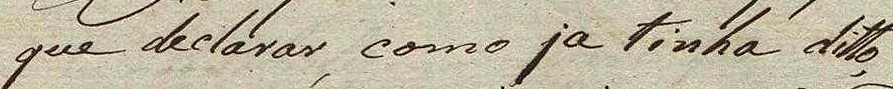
que declarar como ja tinha ditto
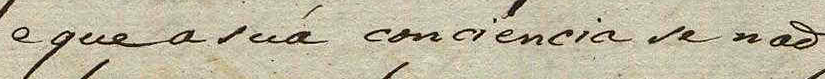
e que a sua conciencia se naõ
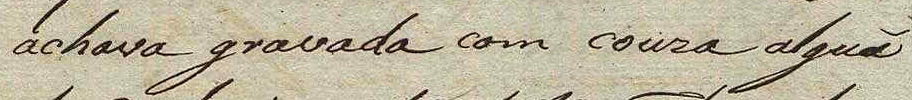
achava gravada com couza alguā
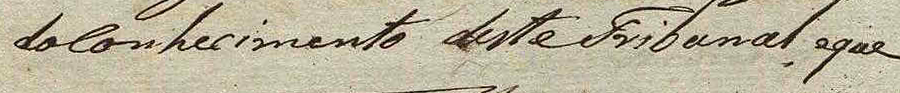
do conhecimento deste Tribunal, e que
